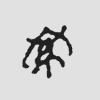終
